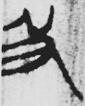及
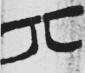亓（其）
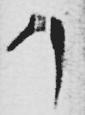人
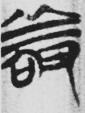敬
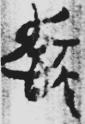○（愛）
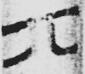亓（其）
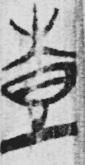○（樹）
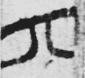亓（其）
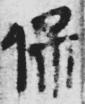保（報）
